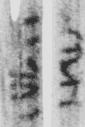聖（聽）
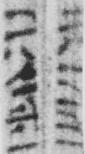○（琴）
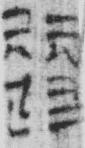○（瑟）
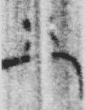之
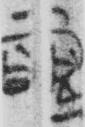聖（聲）
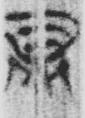鼎（則）
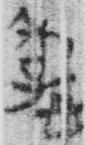悸
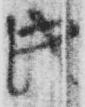女（如）
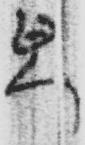也
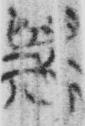斯
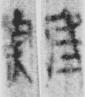難（歎）
